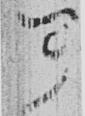乃
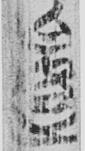退
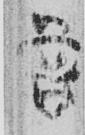言
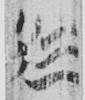於
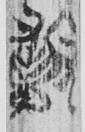○（厲）
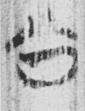公
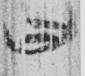曰
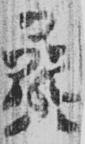參（三）
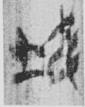○（郤）
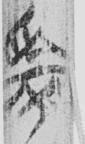家
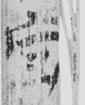厚
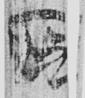取
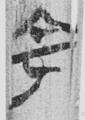宔（主）
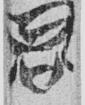君
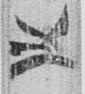之
